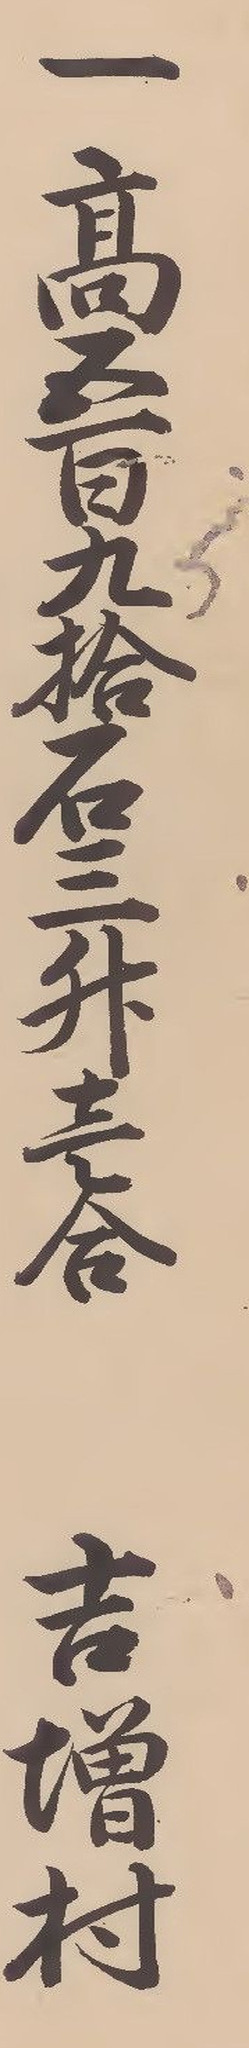一高五百九拾石三升壱合吉増村
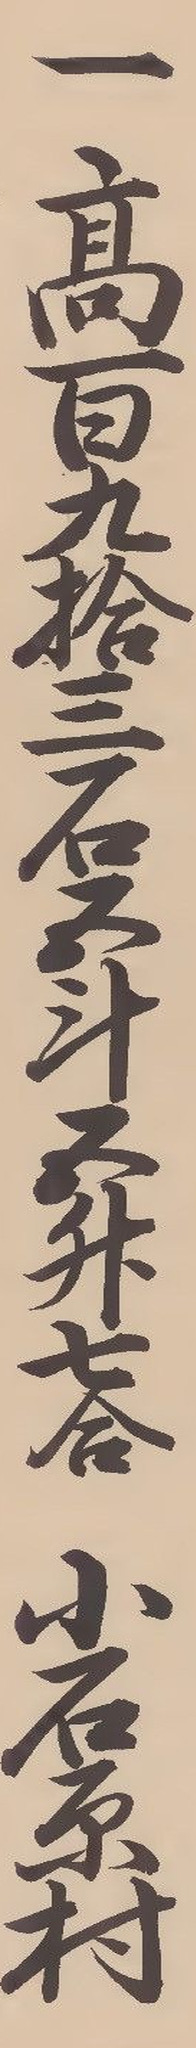一高百九拾三石五斗五升七合小石原村
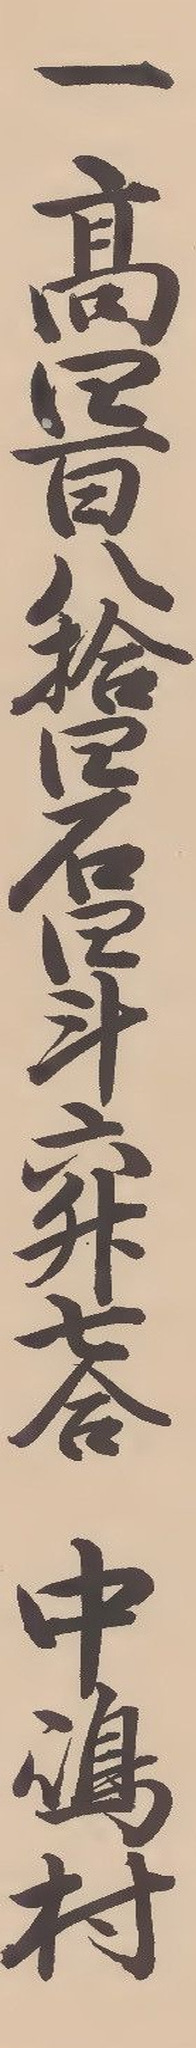一高四百八拾四石四斗六升七合中島村
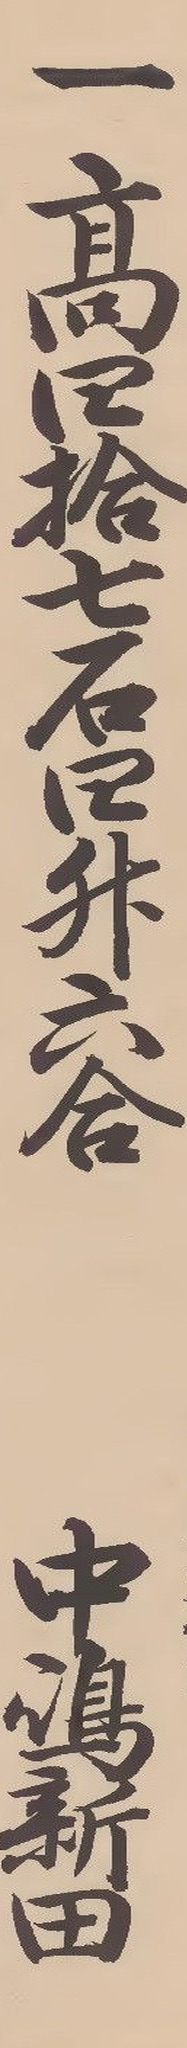一高四拾七石四升六合中島新田
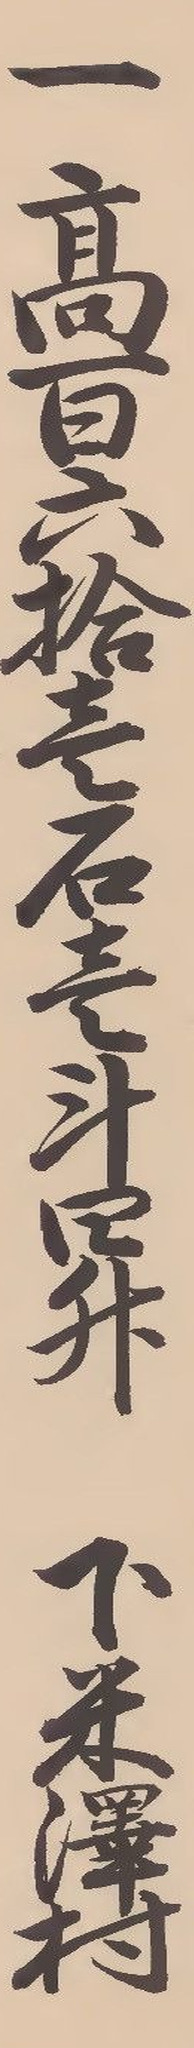一高百六拾壱石壱斗四升下米沢村
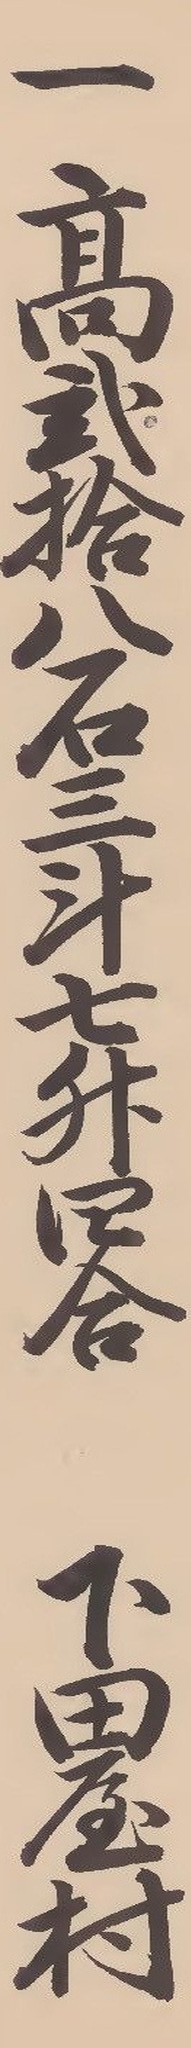一高弐拾八石三斗七升四合下田屋村
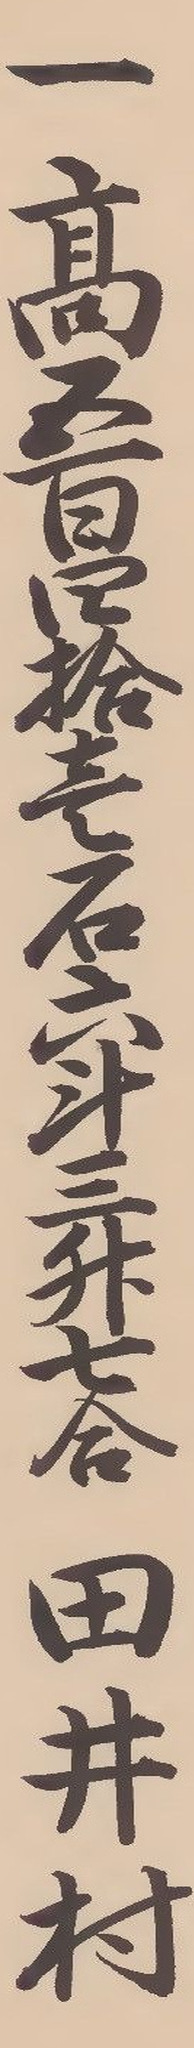一高五百四拾壱石六斗三升七合田井村
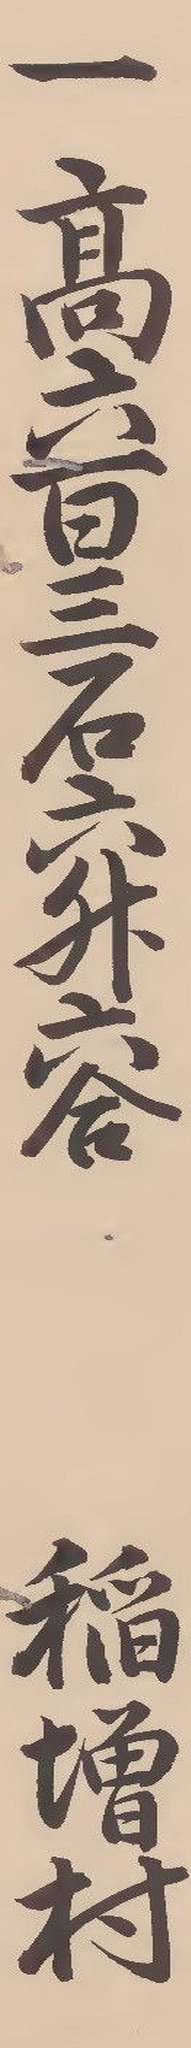一高六百三石六升六合稲増村

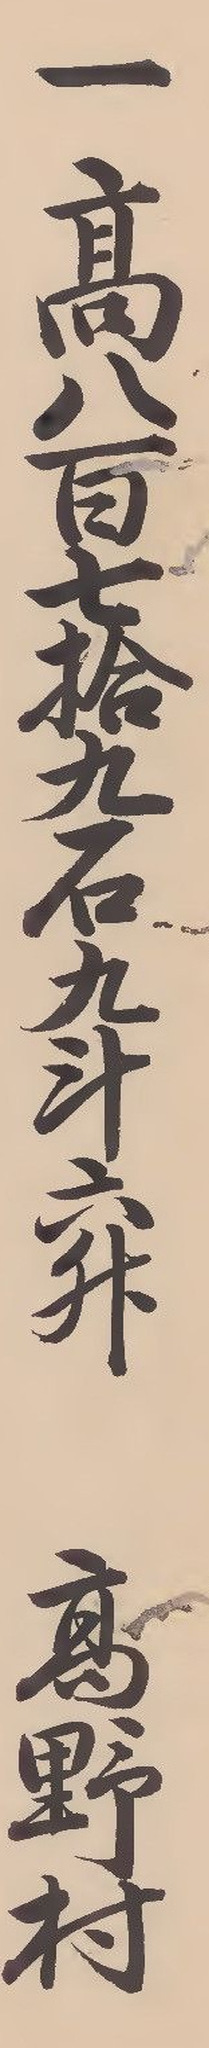一高八百七拾九石九斗六升高野村
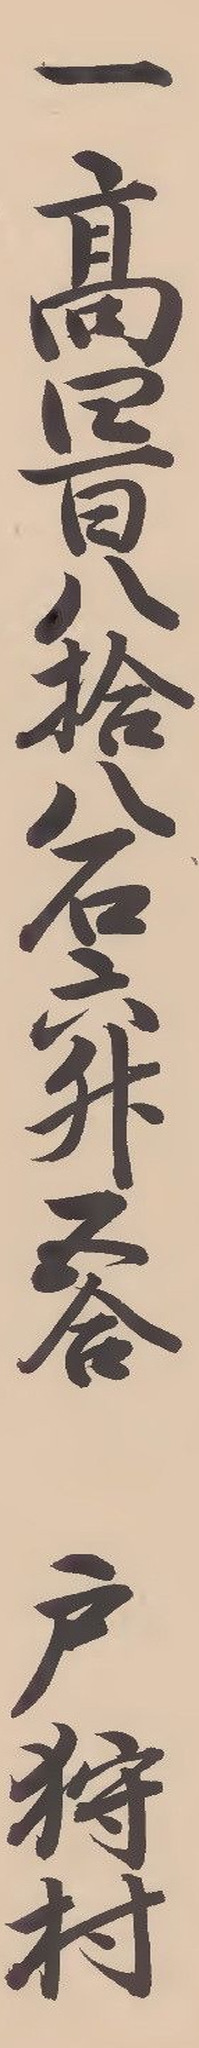一高四百八拾八石六升五合戸狩村
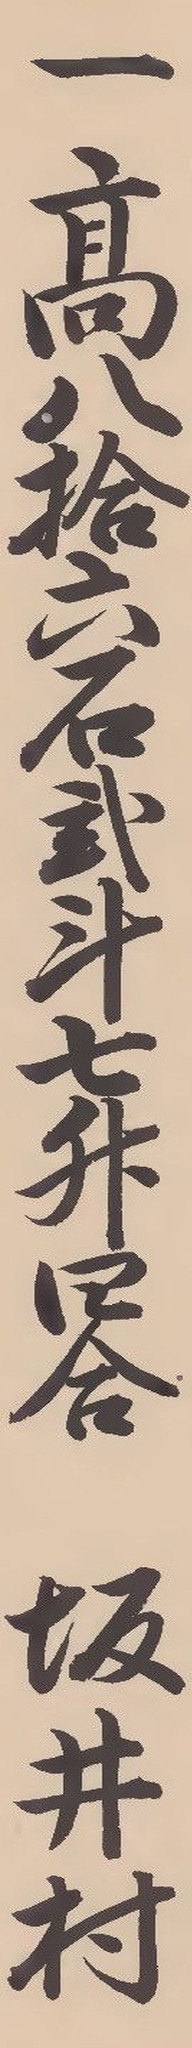一高八拾六石弐斗七升四合坂井村
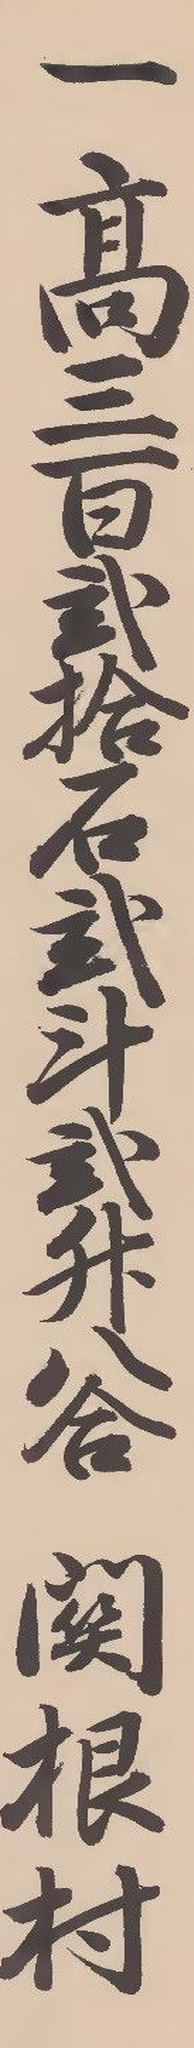一高三百弐拾石弐斗弐升八合関根村
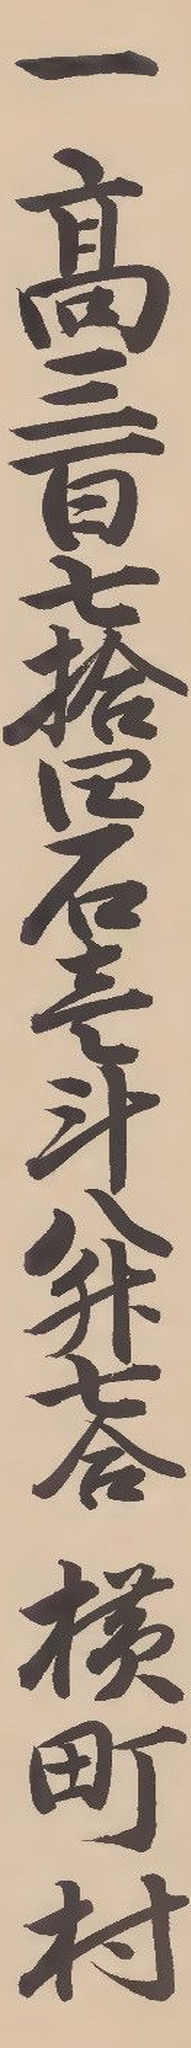一高三百七拾四石壱斗八升七合横町村
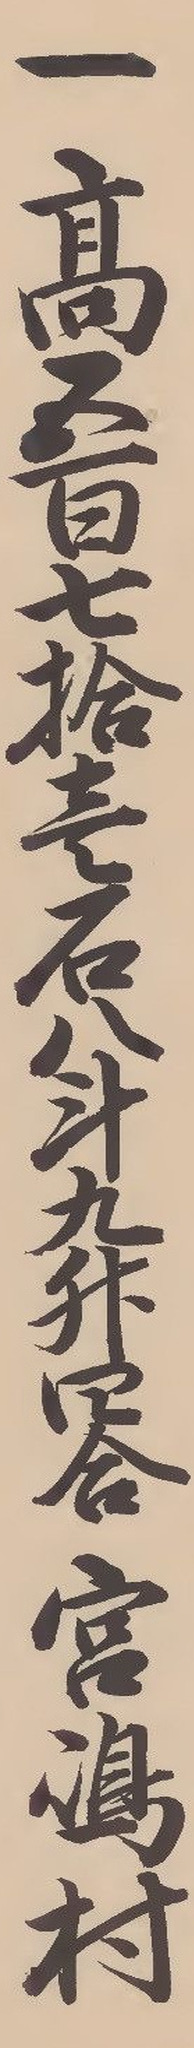一高五百七拾壱石八斗九升四合宮島村
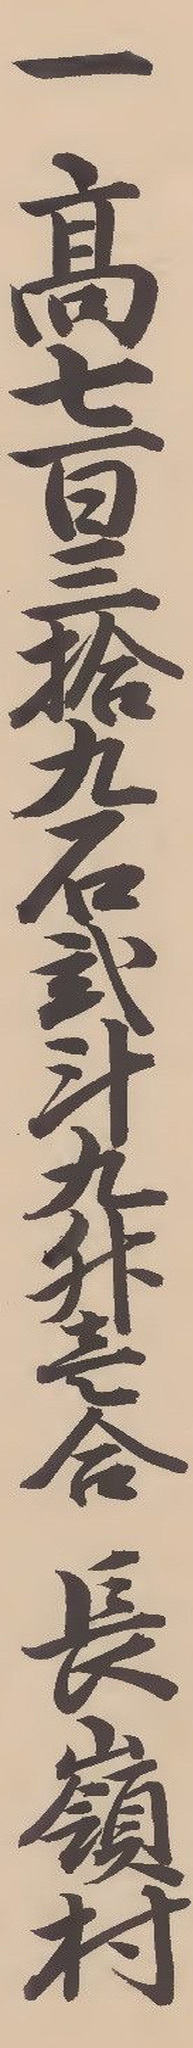一高七百三拾九石弐斗九升壱合長嶺村
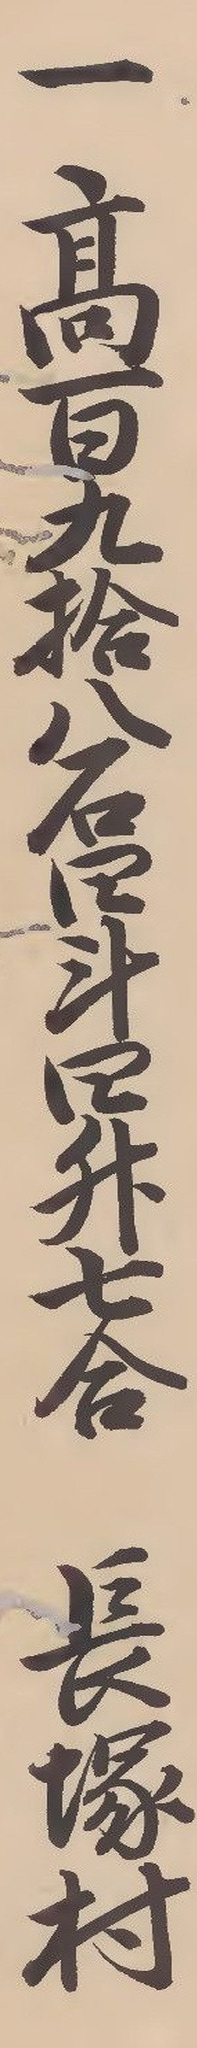一高百九拾八石四斗四升七合長塚村
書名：越後国郷帳　上
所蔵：国立公文書館 National Archives of Japan
